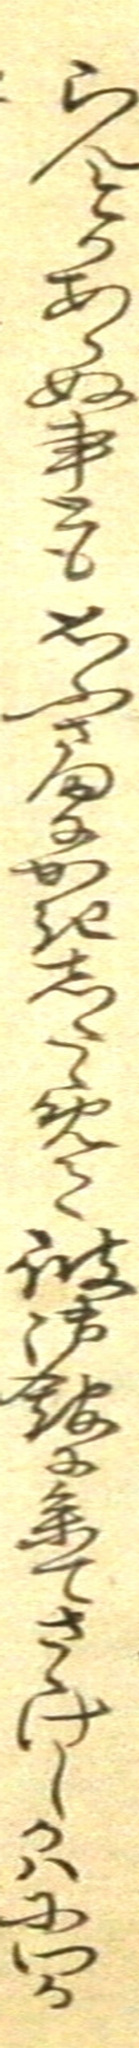らんとかあらぬ事とも思ふさまにかきしたゝめて彼御舘に参てさゝけしかはにわか
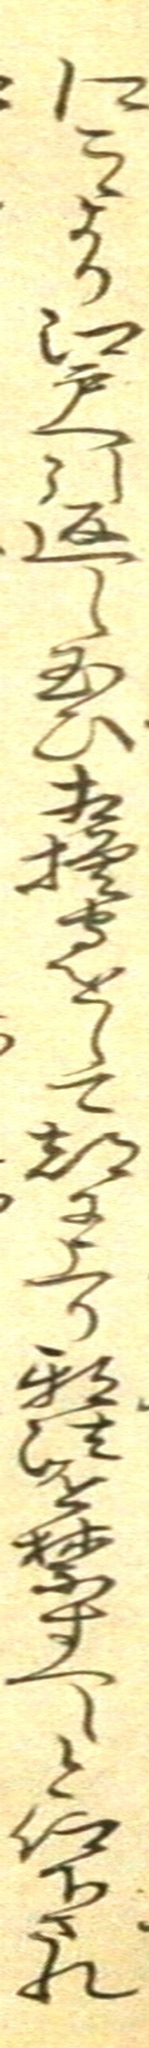にこゝより江戸へ引返し玉ひ相模守をして都に上り邪法を禁すへしと仰下され
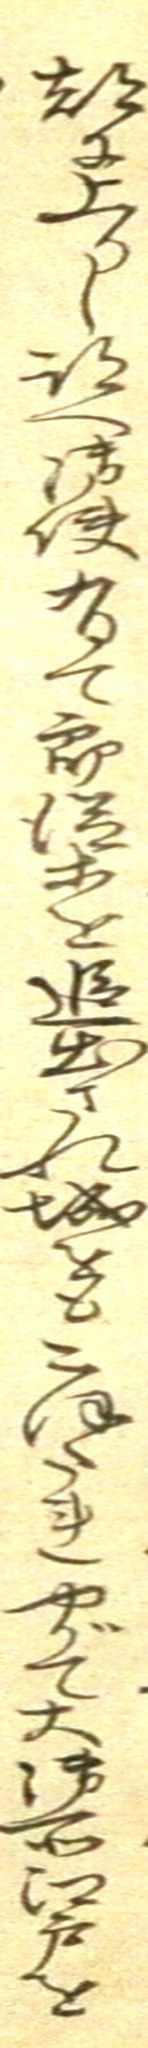都に上りし跡へ御使有て郎従等を追出され城をもこほたれやがて大御所江戸を
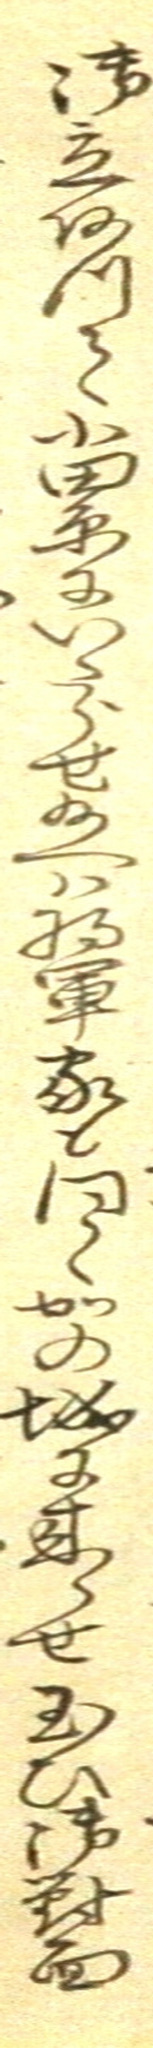御立あつて小田原にいたらせ給へは将軍家も同くかの城に来らせ玉ひ御対面
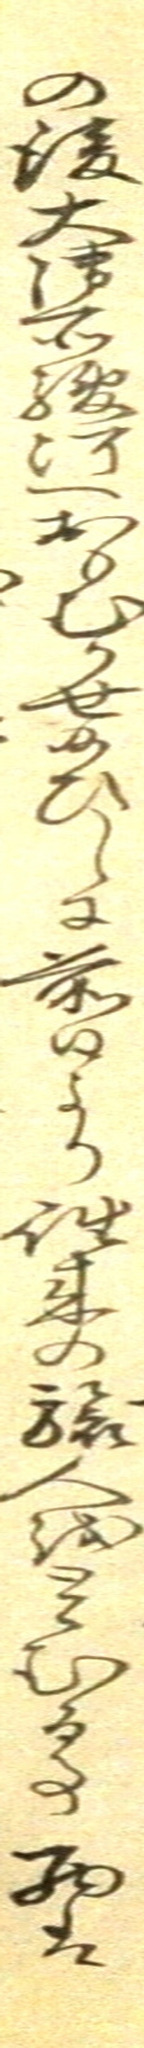の後大御所駿河へおもむかせ給ひしに前日より往来の旅人をとゝむる事西は
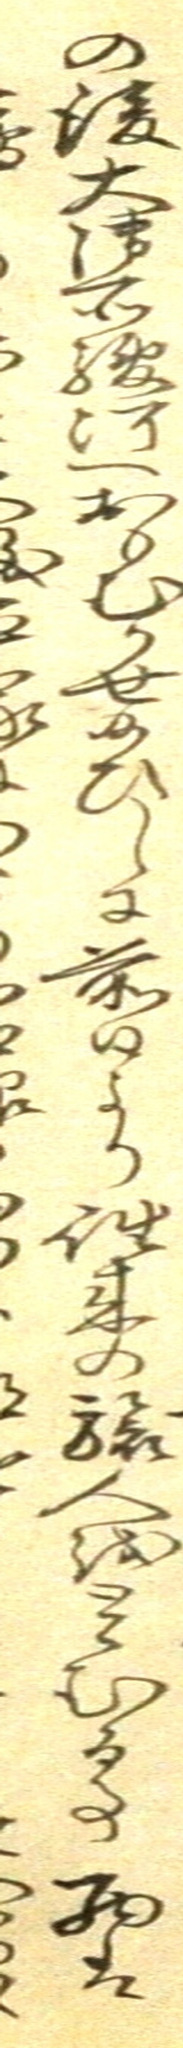の後大御所駿河へおもむかせ給ひしに前日より往来の旅人をとゝむる事西は
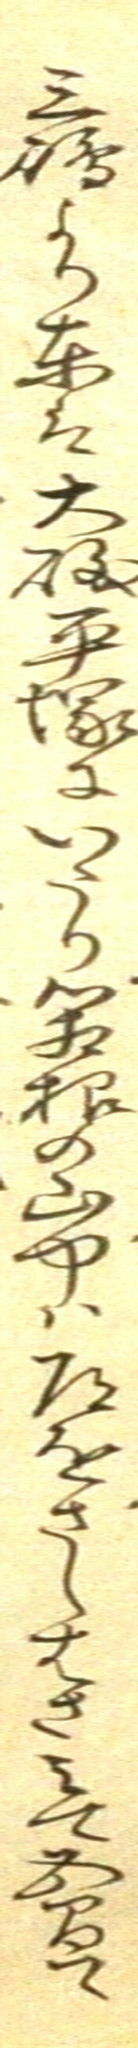三嶋より東は大磯平塚にいたり箱根の山中は道をさしはさみて五間て
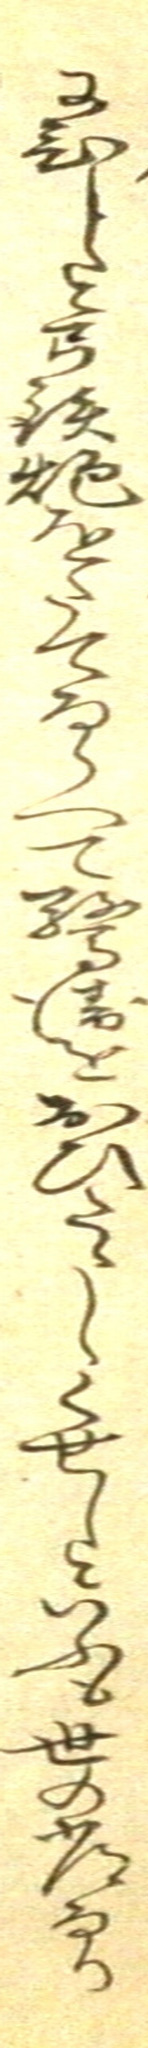にひしと弓鉄炮をたてならへて驚衛をおひたゝしくせしといふも世の常なり
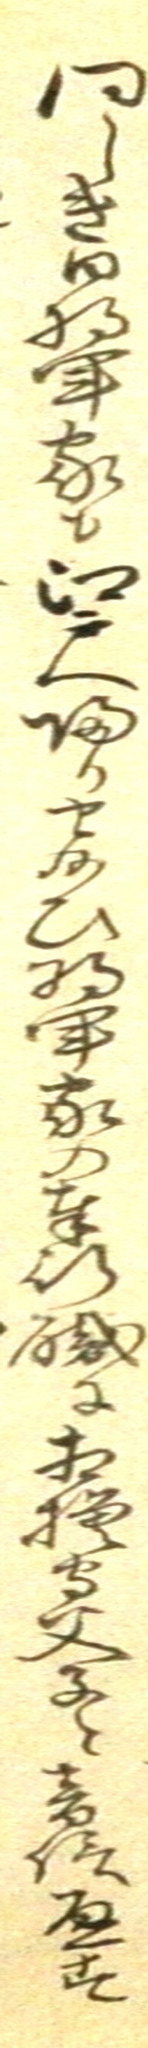同しき日将軍家も江戸へ帰りせ給ひ将軍家の奉行職に相模守父子と音信通す
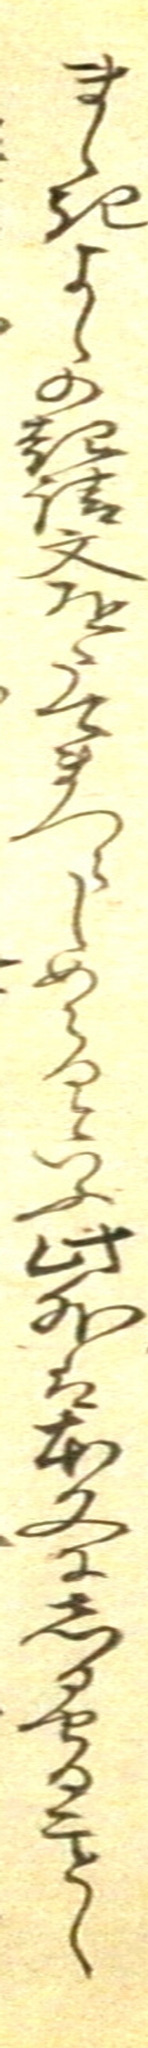ましきよしの起請文をたてまつらしめらるといふ此外は本文にしるせることし
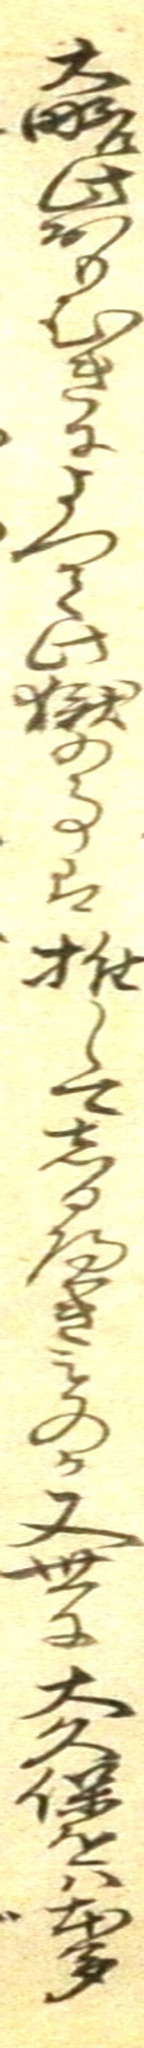大略此おもむきによつて此獄の事は推してしるへきものか又世に大久保をは本多
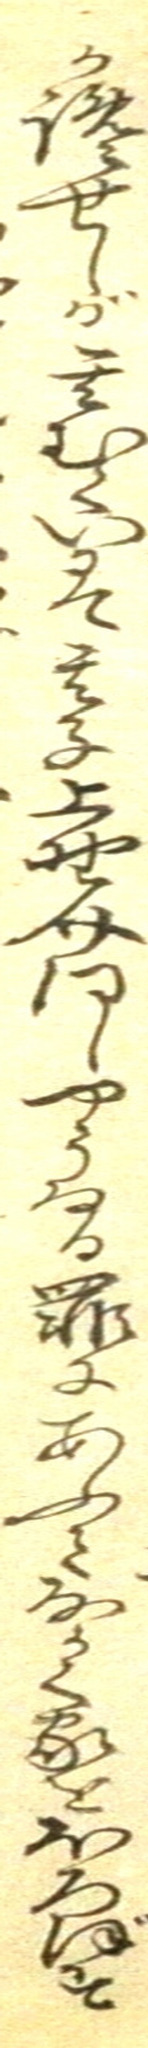か讒せしが其むくいにて其子上野介同しやうなる罪にあふてなかく家をほろぼす
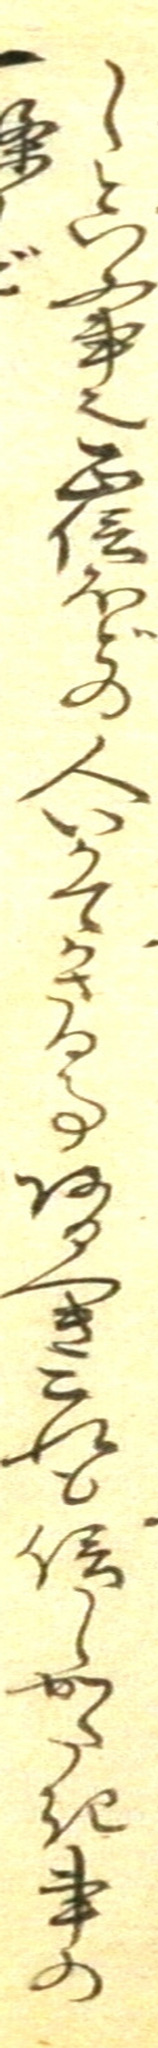しといふ事也正信ほどの人いかてかさる事あるへきこれも信しかたき事の
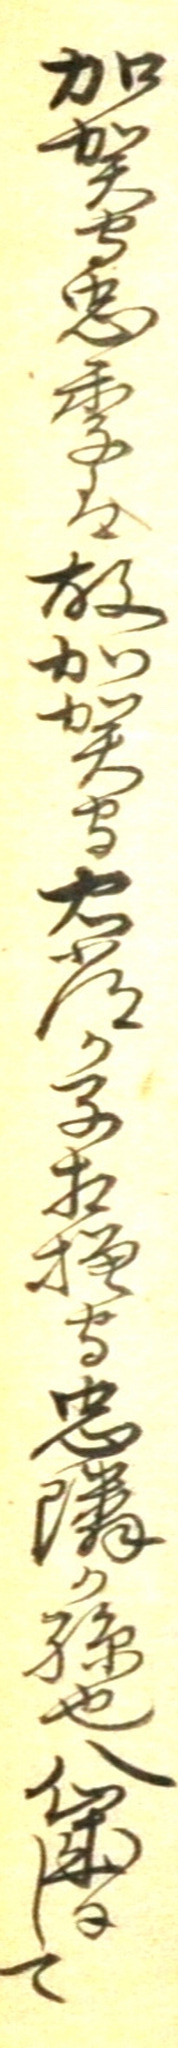加賀守忠季は故加賀守忠常か子相模守忠隣か孫也八歳にして
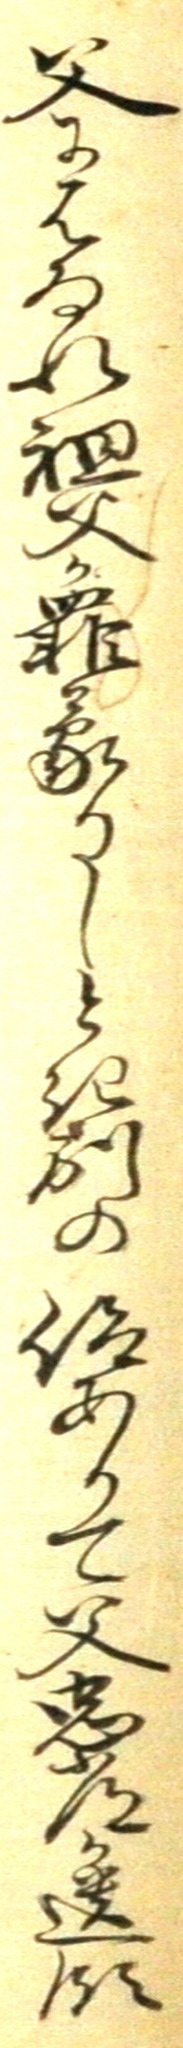父にはなれ祖父か罪蒙りしとき別の仰ありて父忠常か遺領
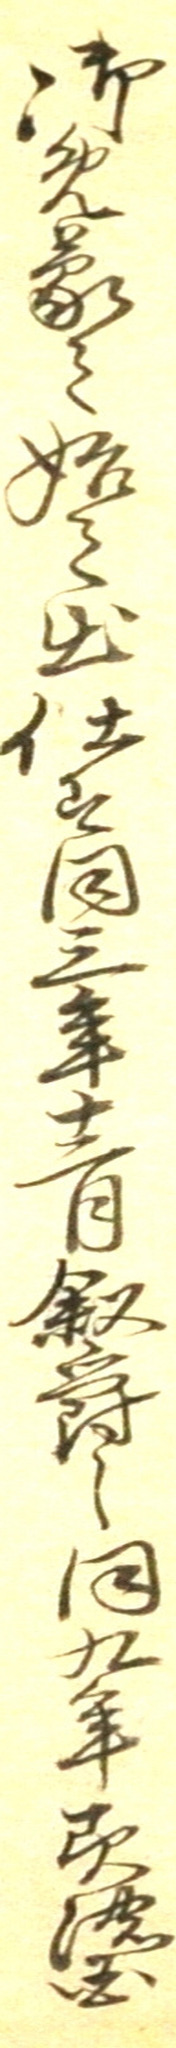御免蒙て始て出仕す同三年十二月叙爵し同九年美濃国
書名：藩翰譜（四・中）
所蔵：伊那市立高遠町図書館・合同会社AMANE
